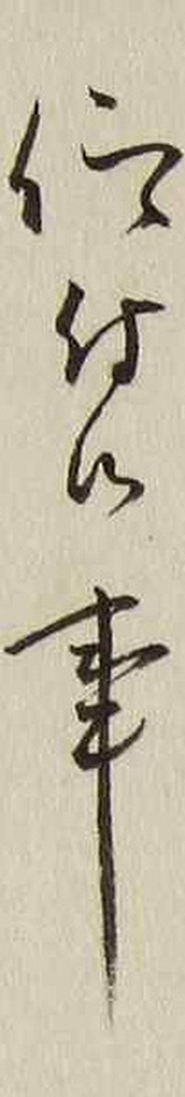仰付候事
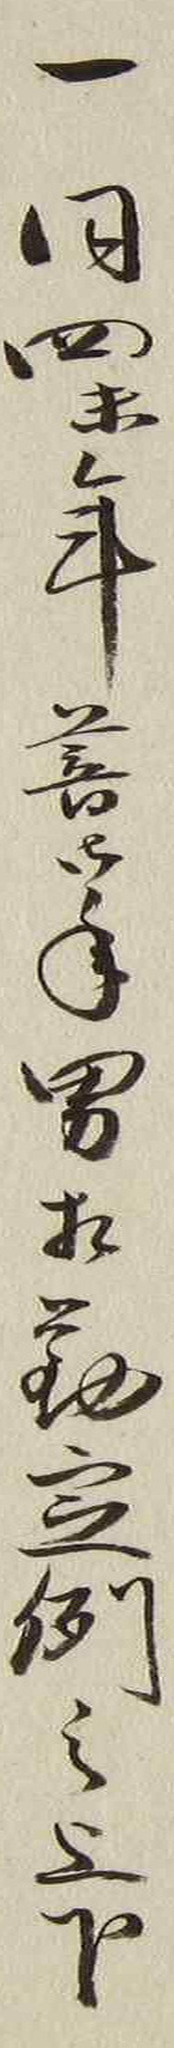一同四未年暮御年男相勤定例之上下
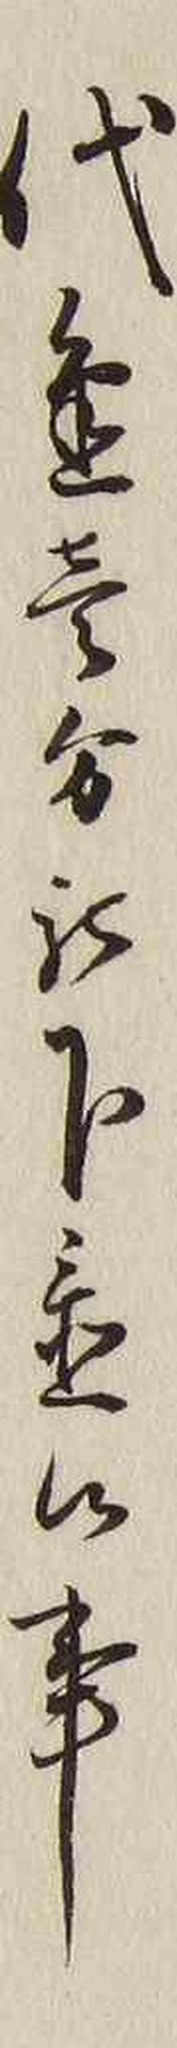代金壱分被下置候事
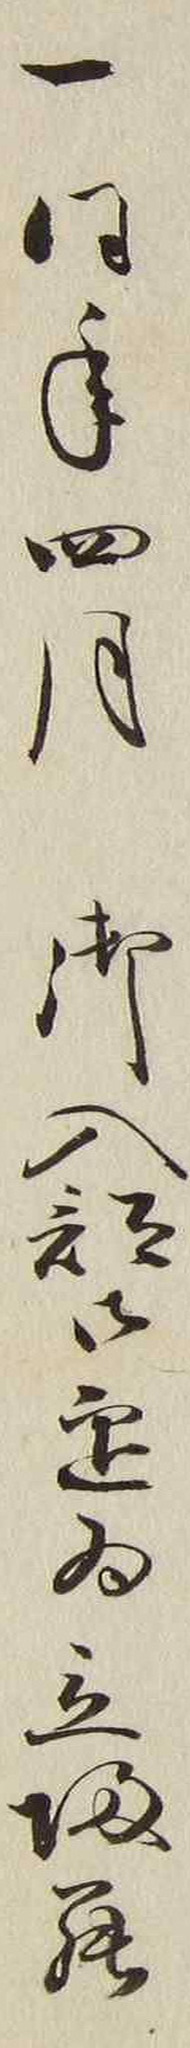一同年四月御入部御迎為立帰罷

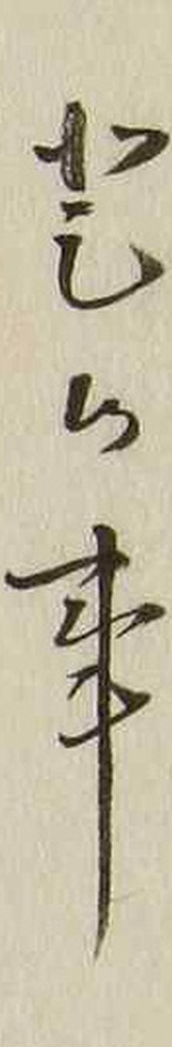登候事
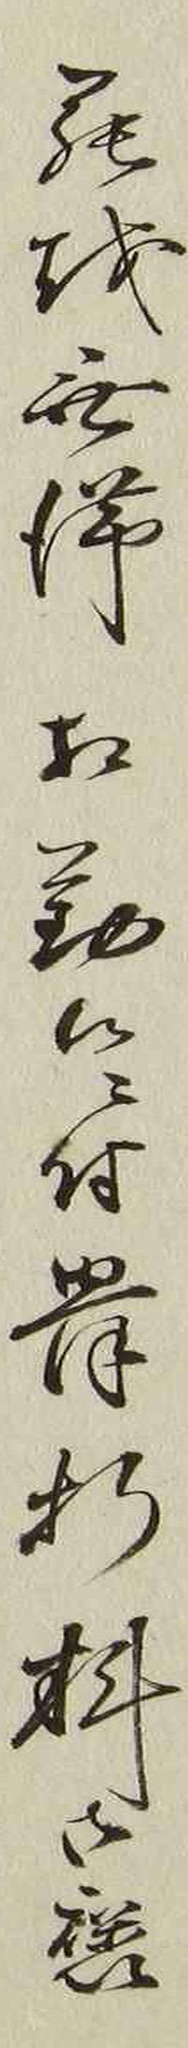罷越無滞相勤候ニ付骨折料御褒
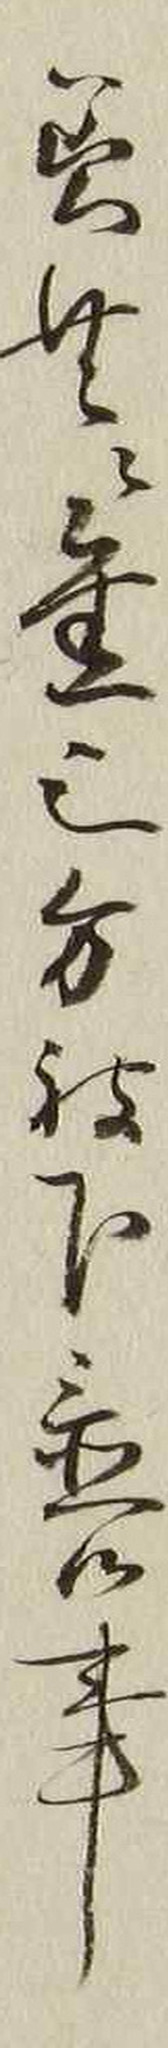美共ニ金三分被下置候事
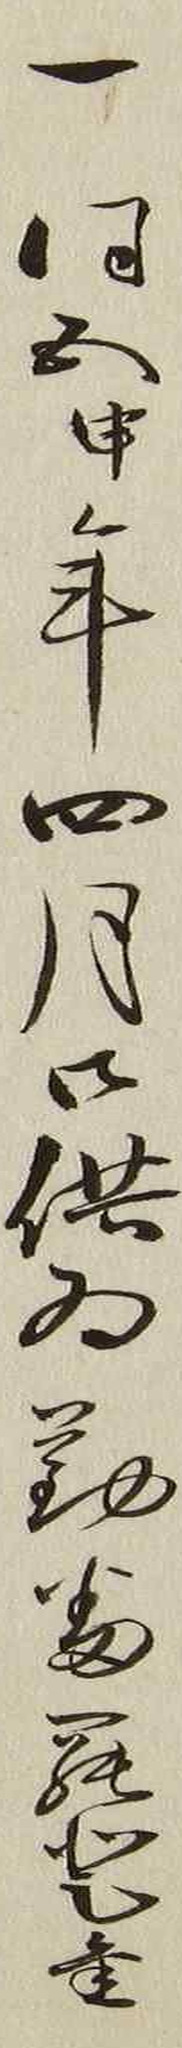一同五申年四月御供為勤番罷登金
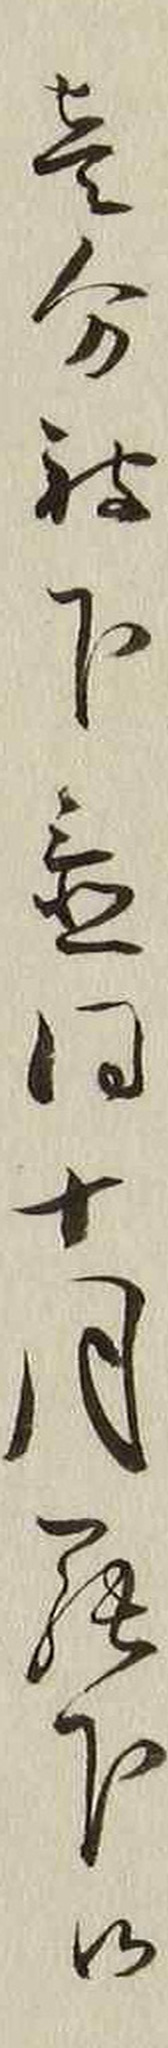壱分被下置同十月罷下候
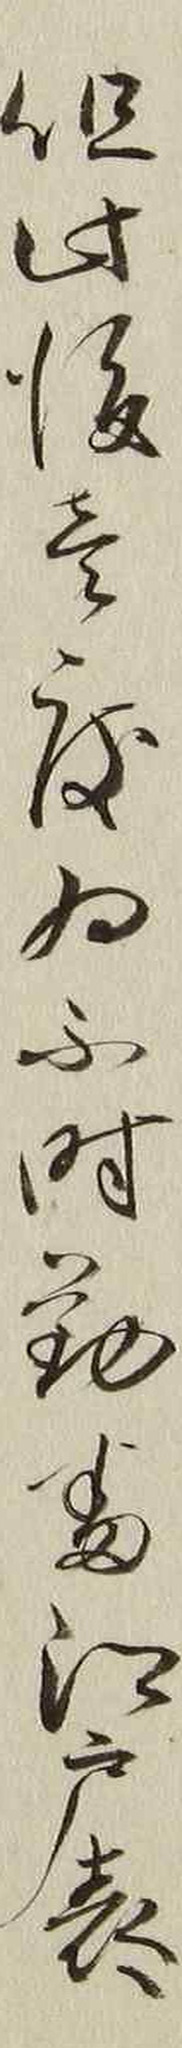但此後壱度為不時勤番江戸表ㇸ
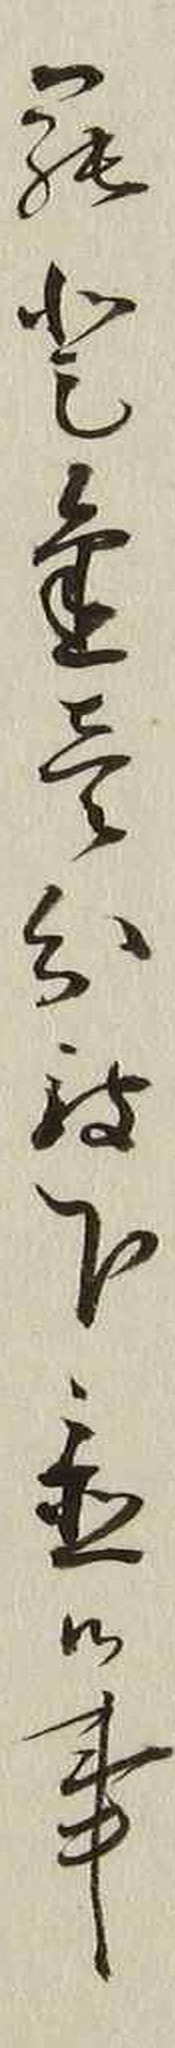罷登金壱分被下置候事
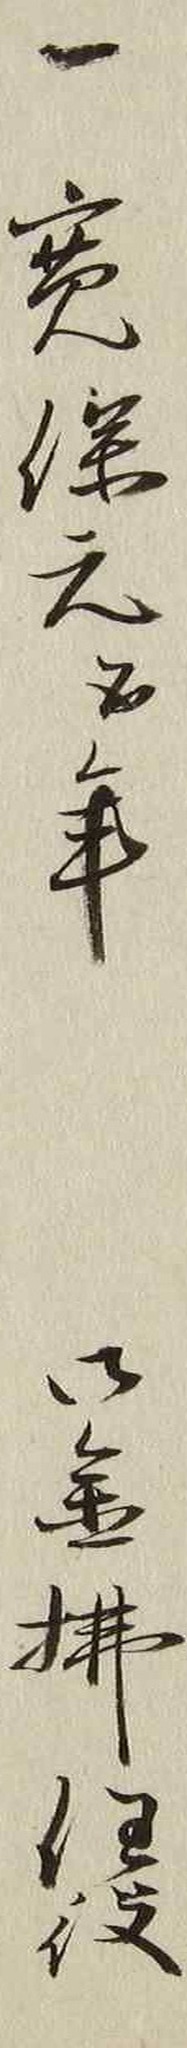一寛保元酉年御金払任役
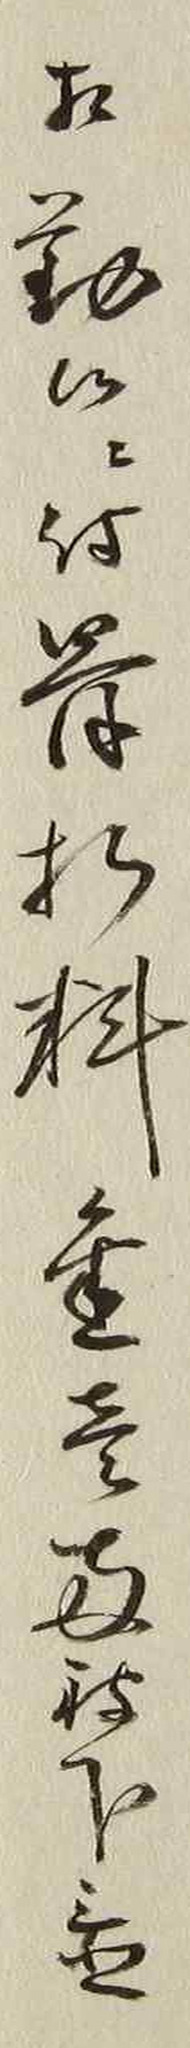相勤候ニ付骨折料金壱両被下置
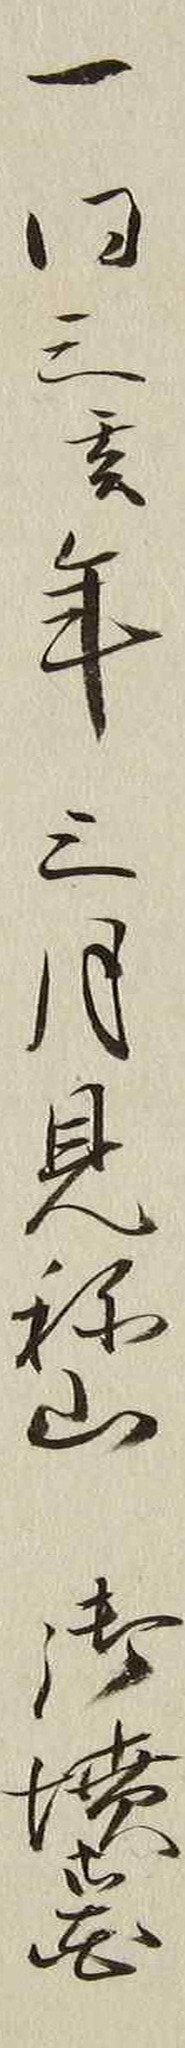一同三亥年三月見祢山御墳御固
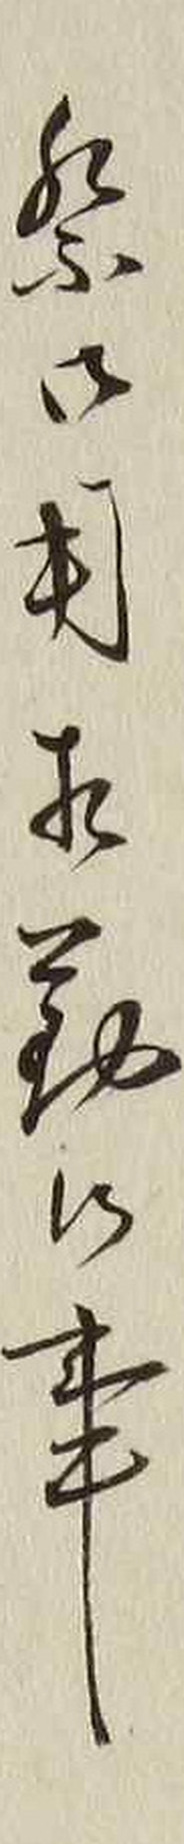祭御用相勤候事
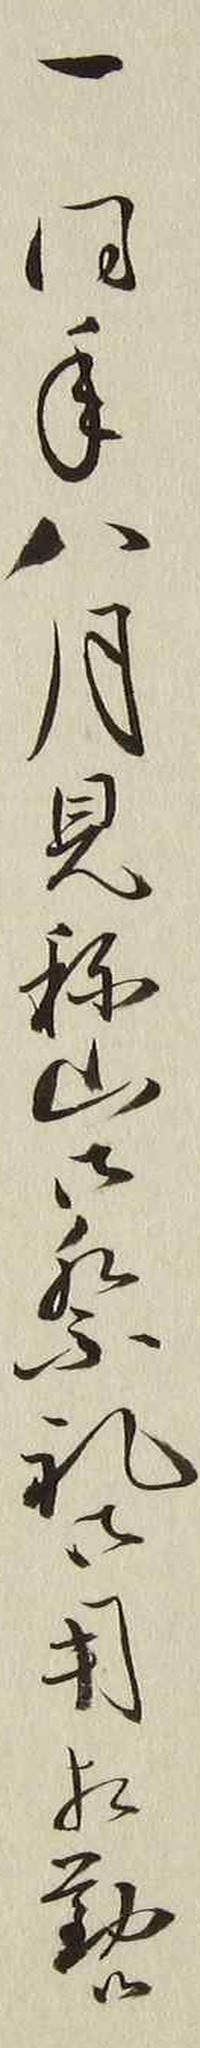一同年八月見祢山御祭礼御用相勤候
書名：諸士系譜　巻之163　な之部5
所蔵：会津若松市立会津図書館
